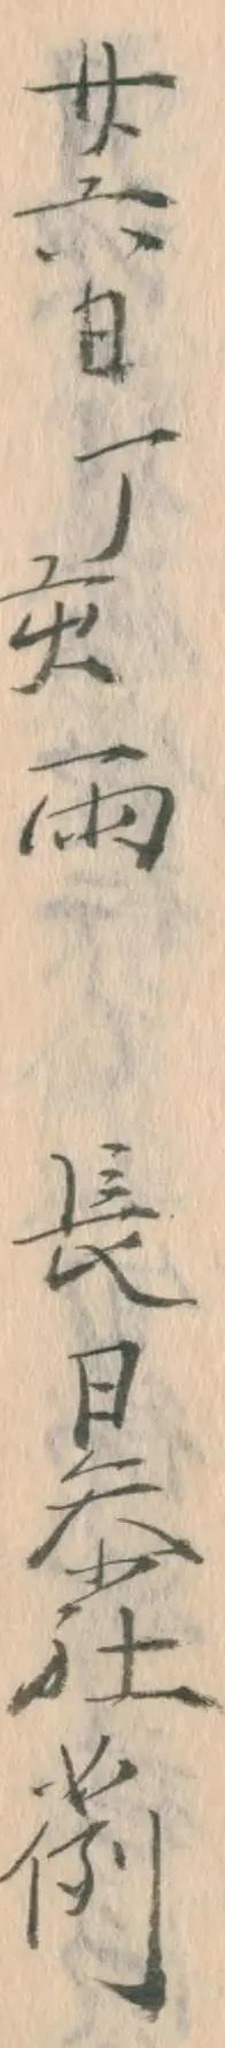廿六日丁亥雨長日参社め例
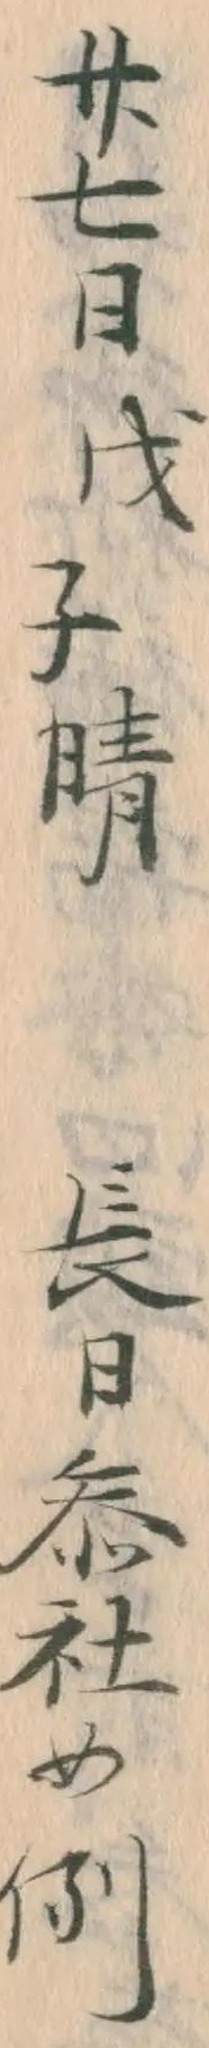廿七日戊子晴長日参社如例
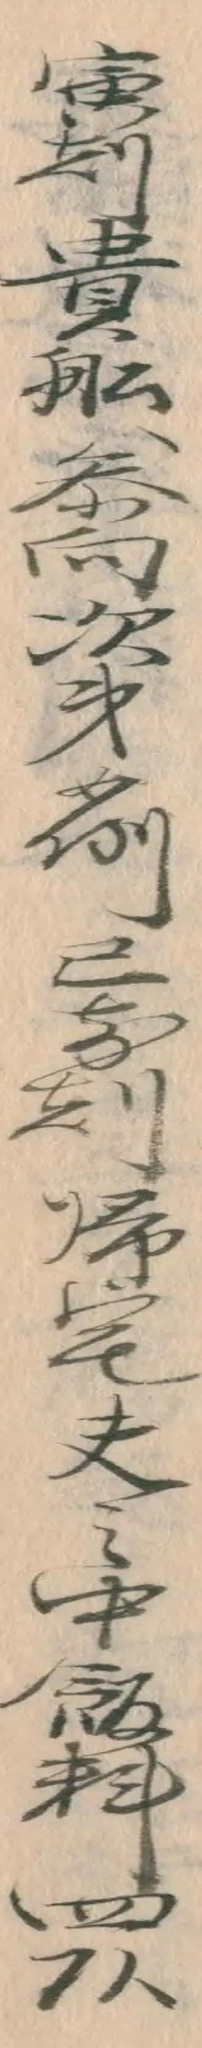一寅刻貴舩へ参向次第如例巳前刻帰宅夫之中飯料四頭
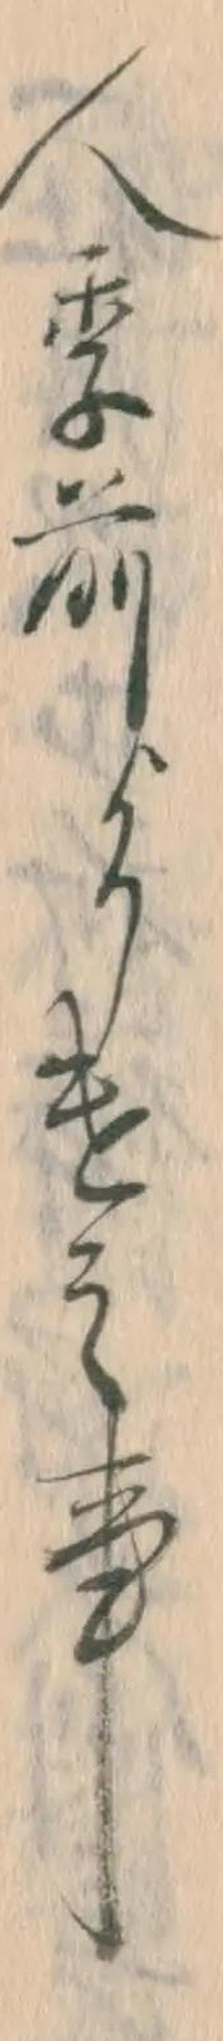人季前より遣之事
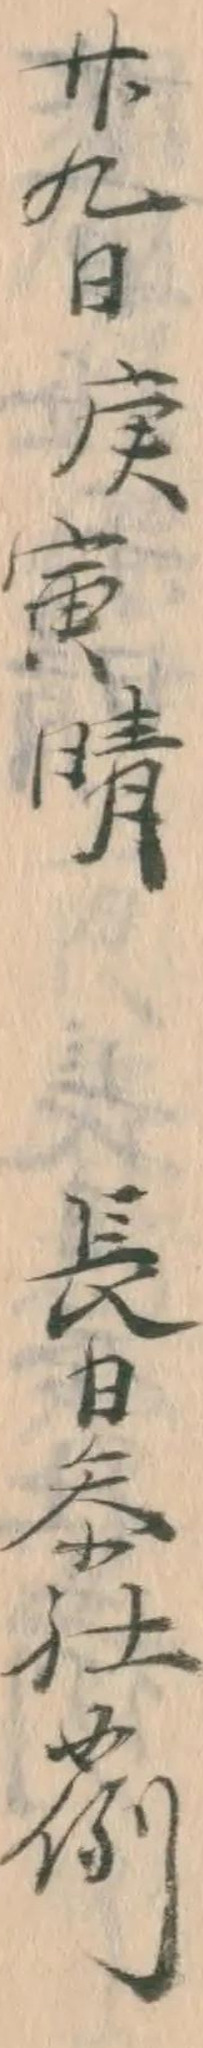廿九日庚寅晴長日参社如例
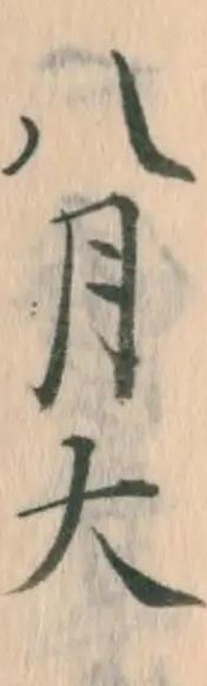八月大
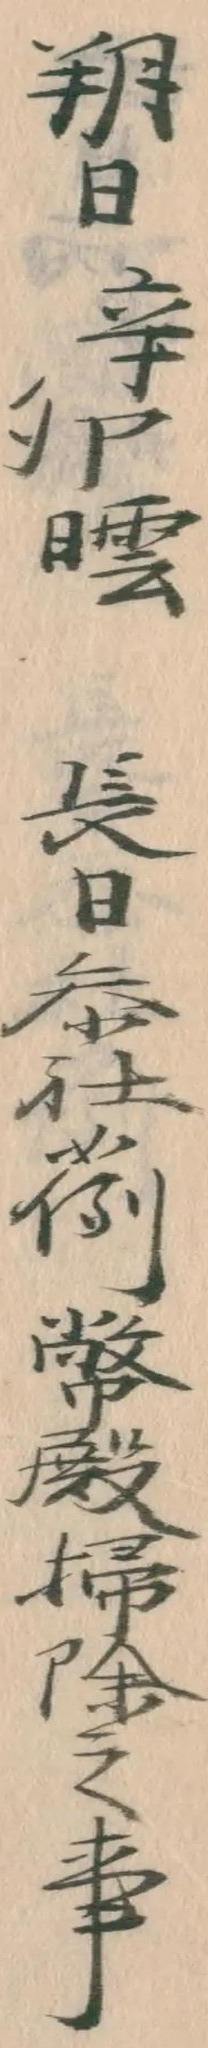朔日辛卯曇長日参仕如例幣殿掃除之事
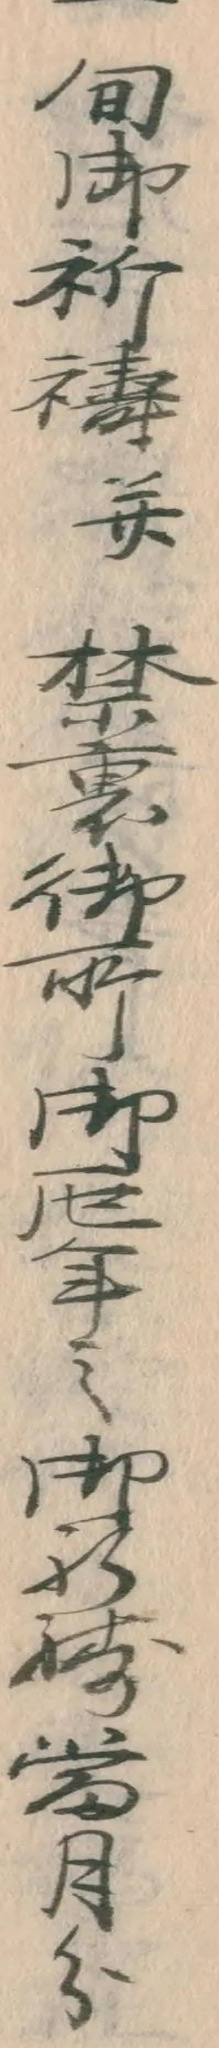一旬御祈祷并禁裏御所御厄年之御祈禱當月分
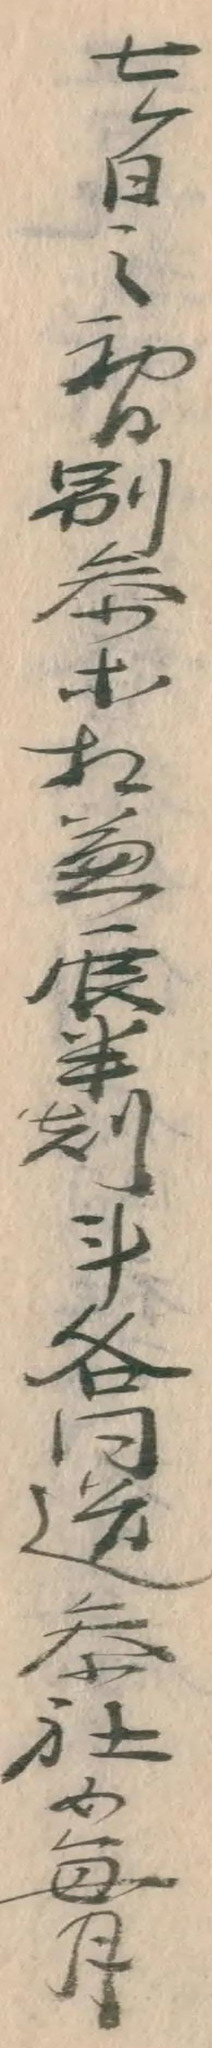七ヶ日之初日別参等相兼辰半刻斗各同道参社如毎月
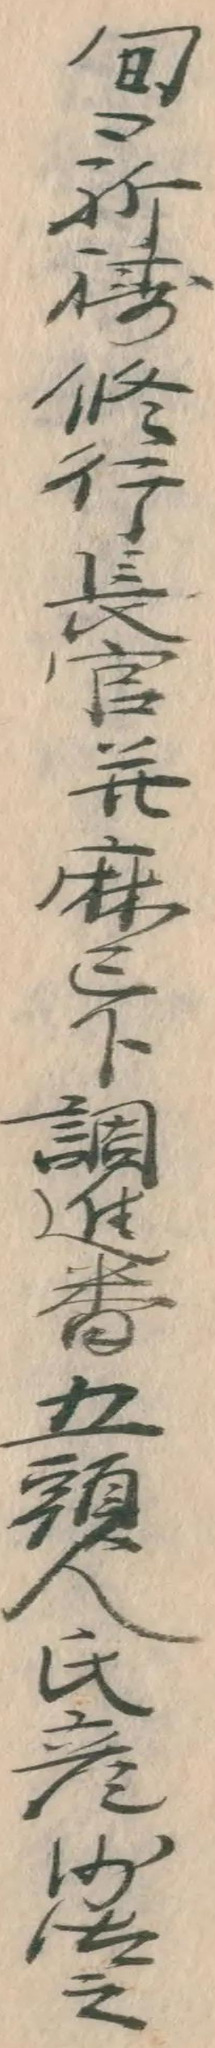旬御祈祷修行長官并麻已下調進番五頭人氏産沙汰之
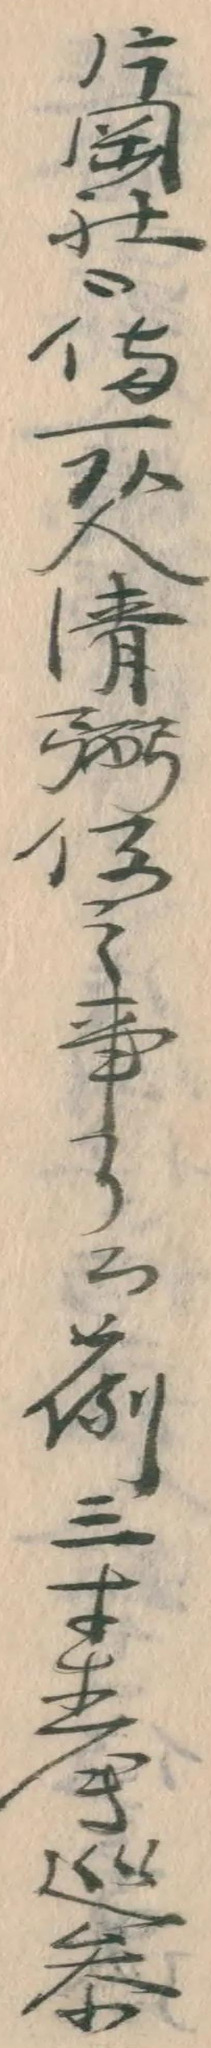片岡社御備一頭人清弼役之事了而如例三寸直會巡参
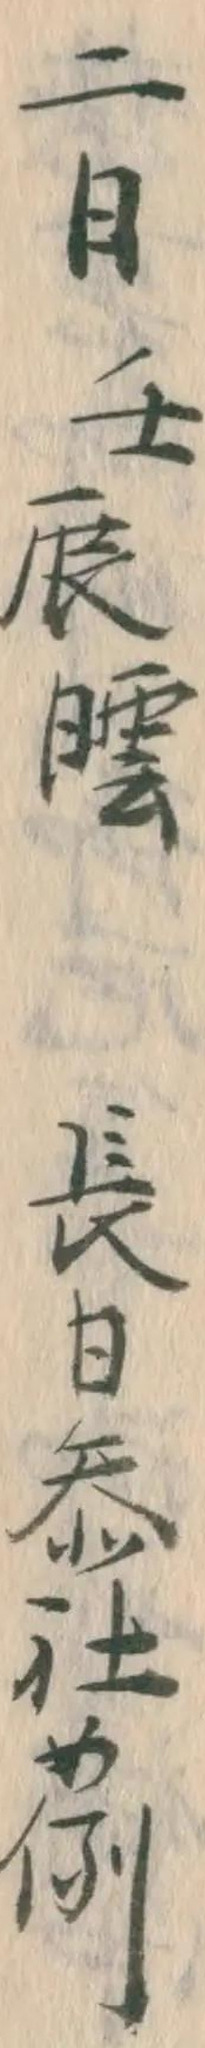二日壬辰曇長日参社如例
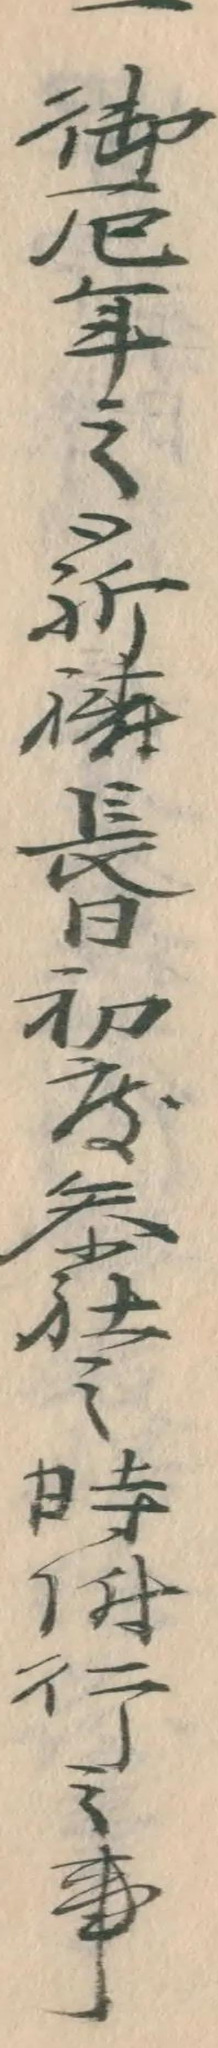一御厄年之御祈祷長日初度参社之時附行之事
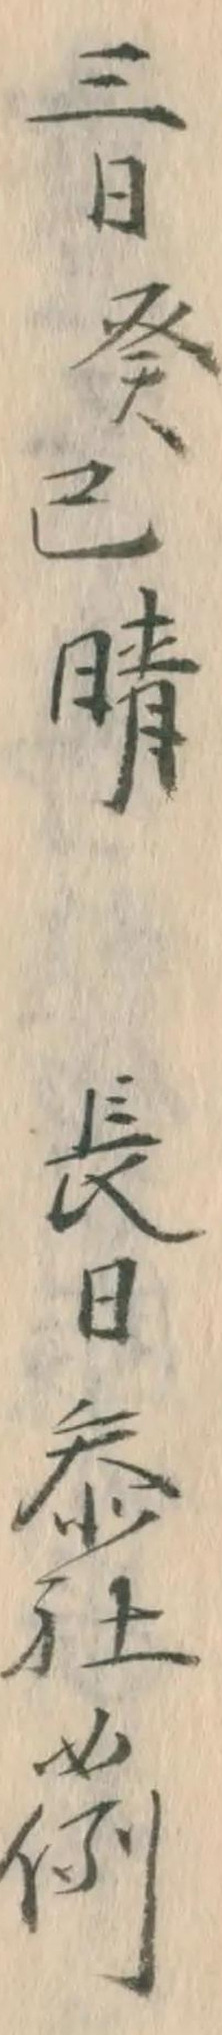三日癸巳晴長日参社如例

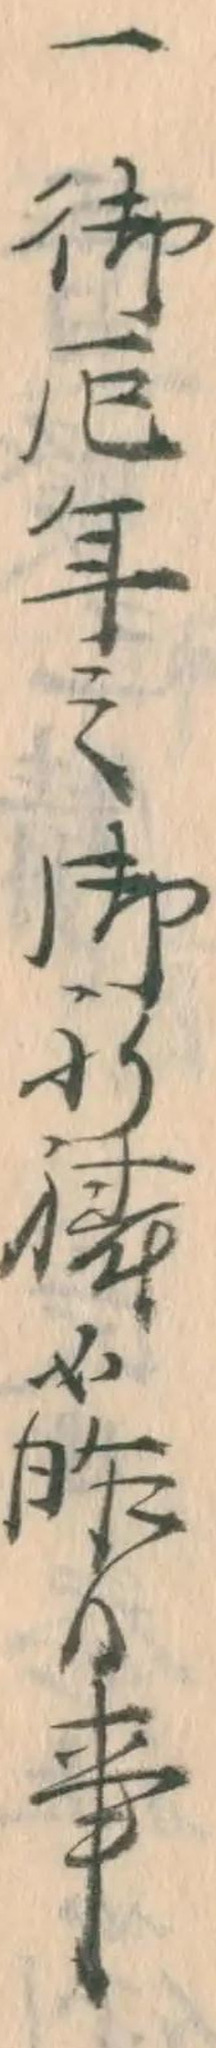一御厄年之御祈祷如昨日事
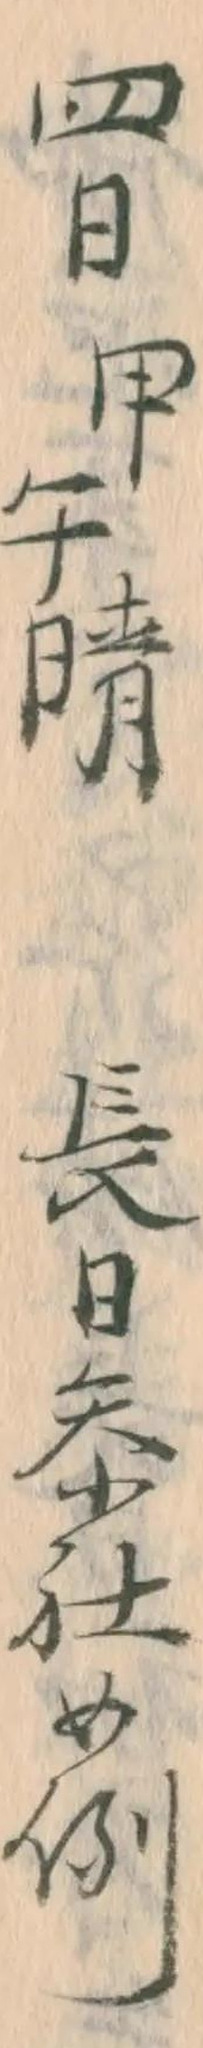四日甲午晴長日参社如例
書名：賀茂社記録. 第73冊
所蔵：国立国会図書館 National Diet Library, JAPAN
